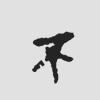不
